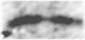一
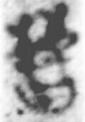晉
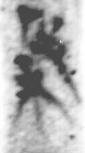杸
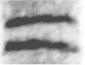二
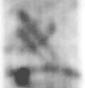之
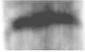一
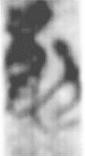○（貂）
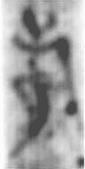旂
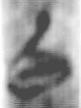白
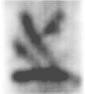之
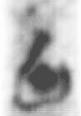首
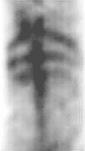羊
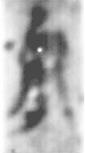須
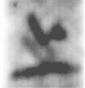之
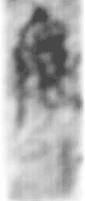○（紕）
